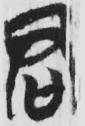君
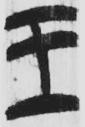王
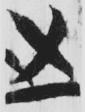之
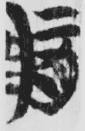𨟻（將）
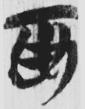爲
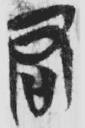君
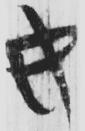女（如）
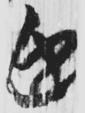臣
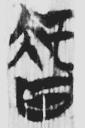智（知）
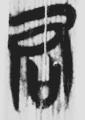君
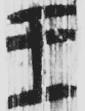王
